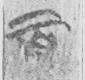百
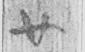廿
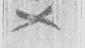五
